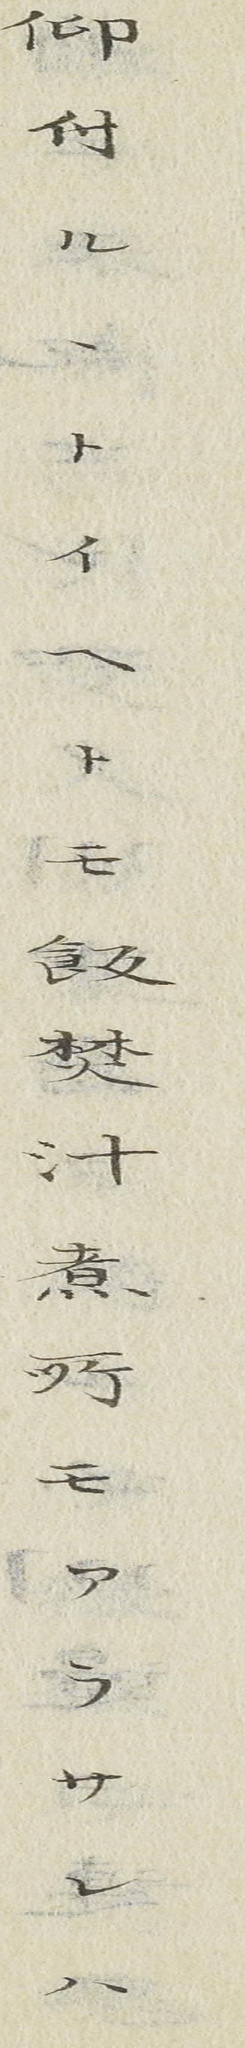仰付ルヽトイヘトモ飯焚汁煮所モアラサレハ
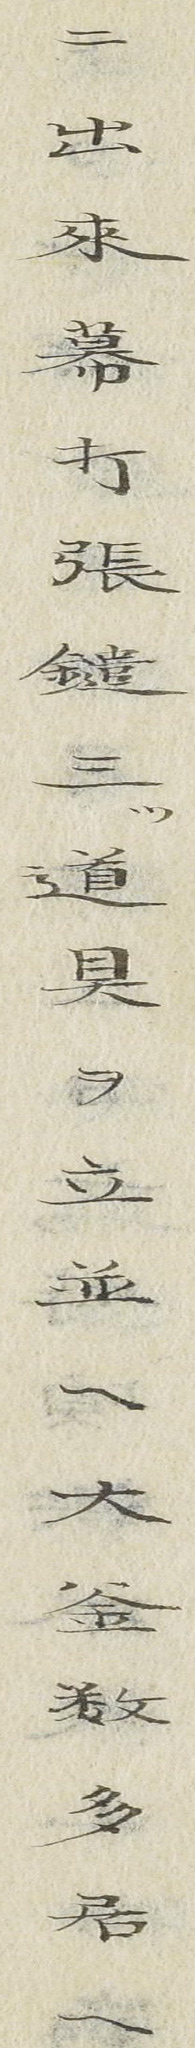ニ出来幕打張鑓三ツ道具ヲ立並ヘ大釜数多居ヘ
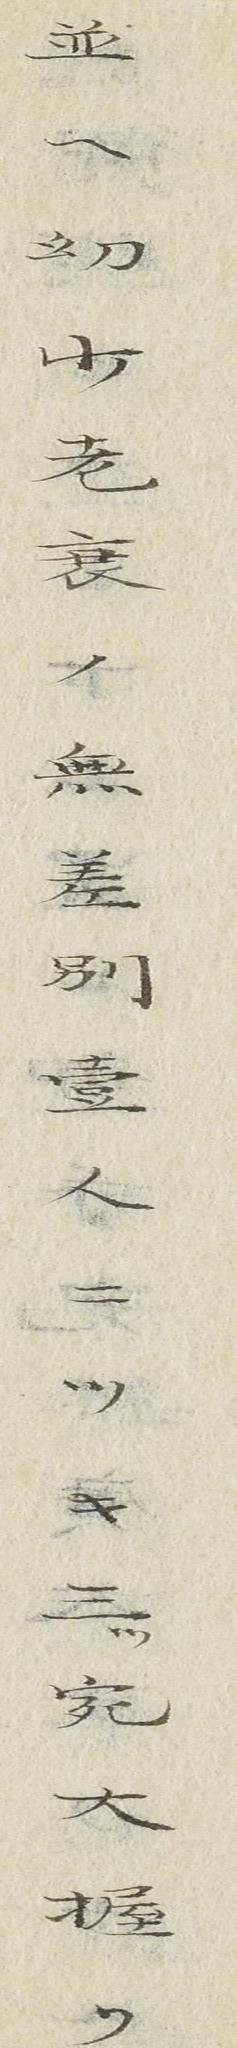並ヘ幼少老衰ノ無差別一人ニツキ三ツ宛大握リ
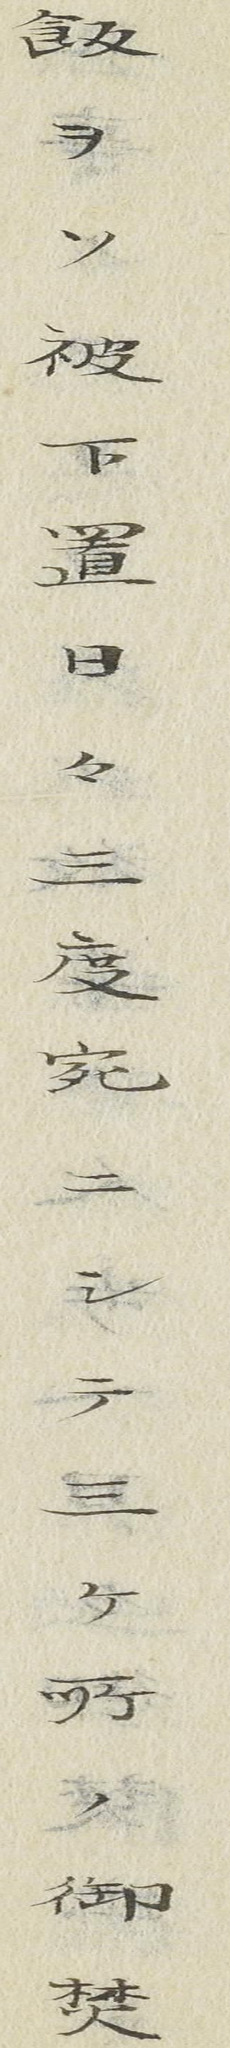飯ヲソ被下置日々三度宛ニシテ三ケ所ノ御焚
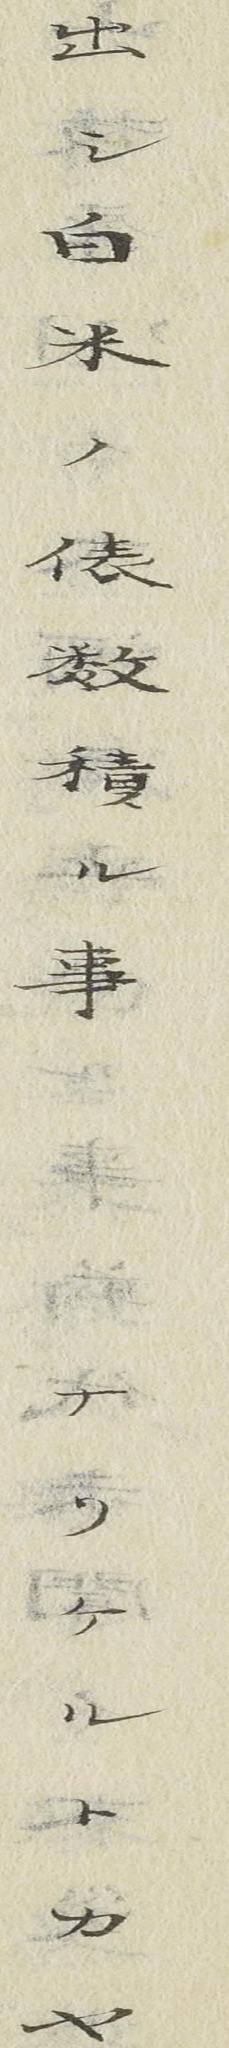出シ白米ノ俵数積ル事ナリケルトカヤ
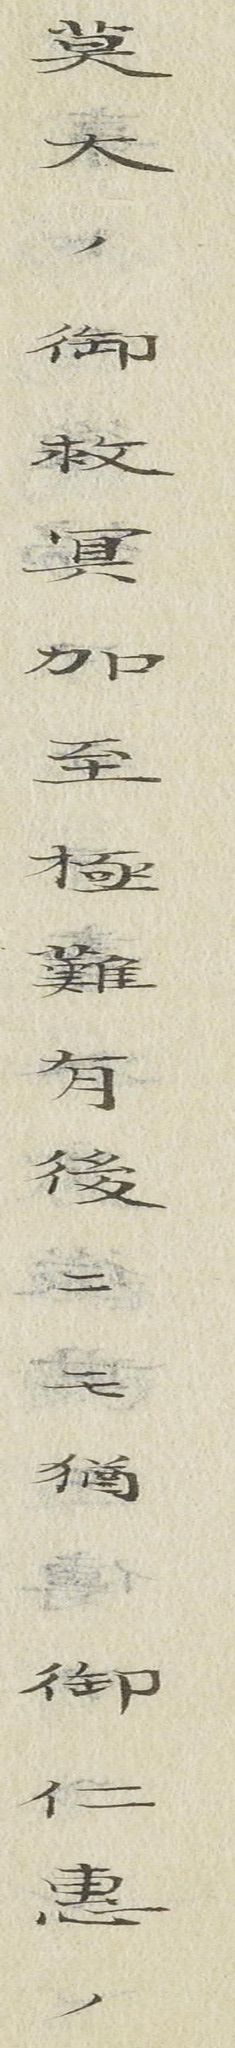莫大ノ御救冥加至極難有後ニモ猶御仁恵ノ
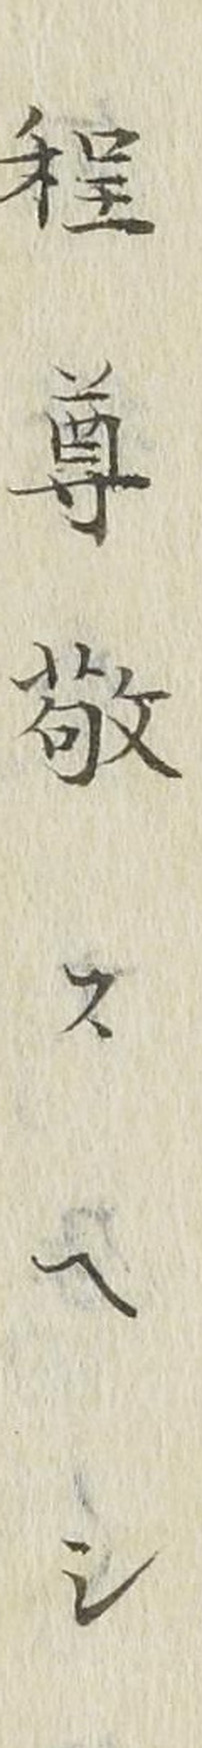程尊敬スヘシ
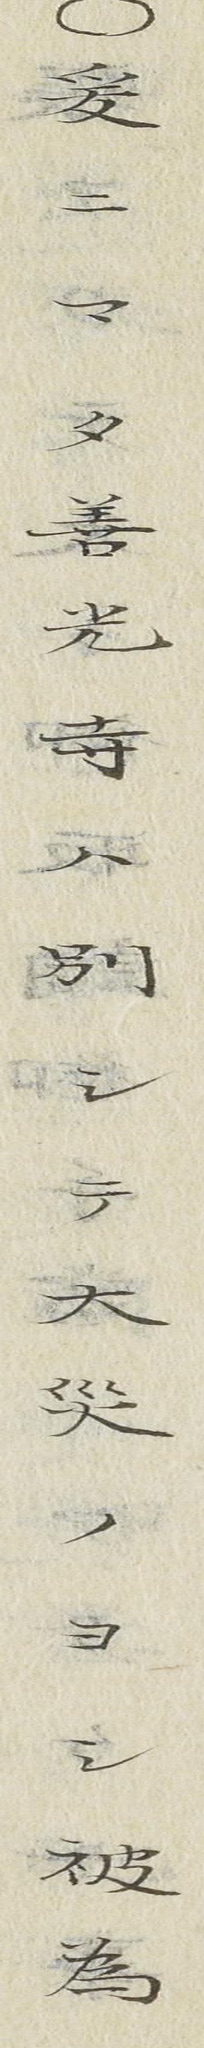〇爰ニマタ善光寺ハ別シテ大災ノヨシ被為
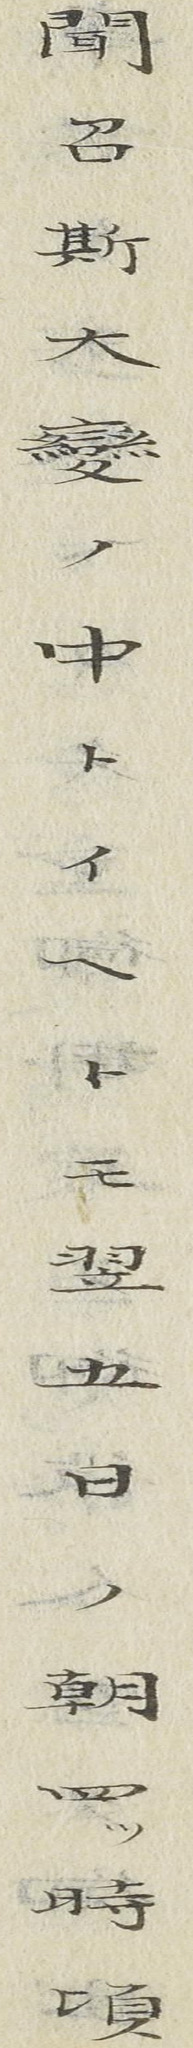聞召斯大変ノ中トイヘトモ翌五日ノ朝四ツ時頃
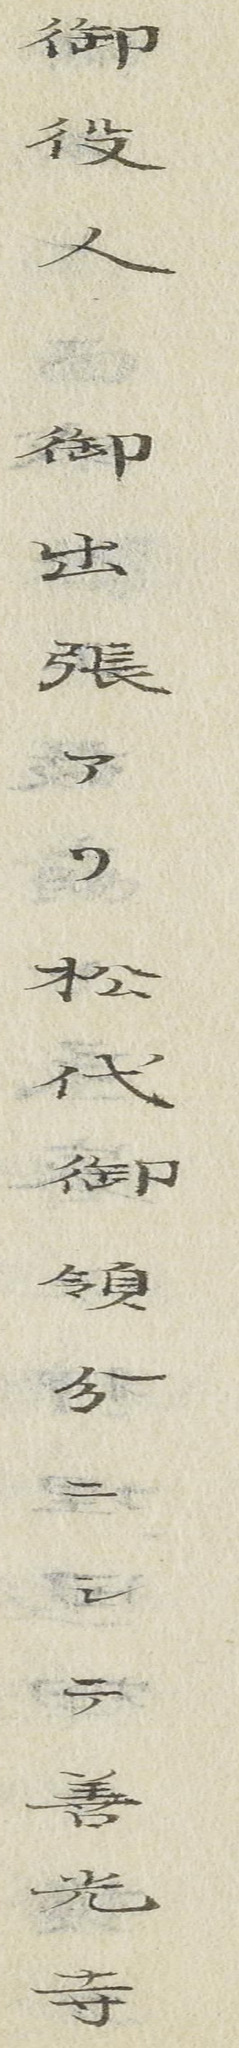御役人御出張アリ松代御領分ニシテ善光寺
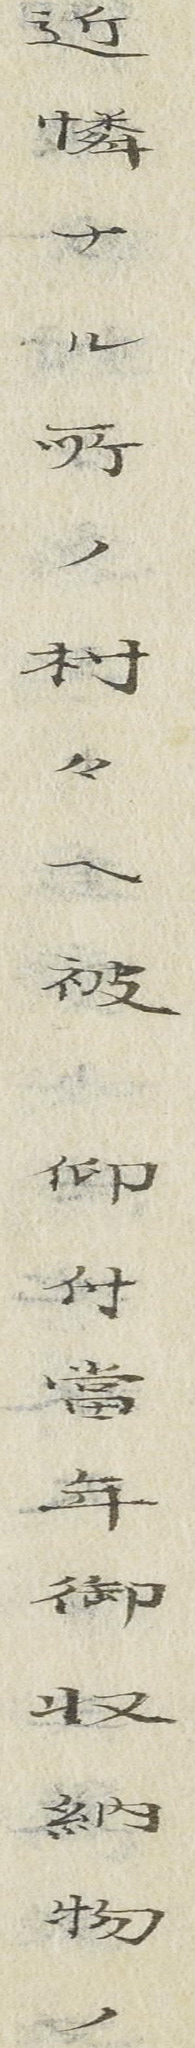近隣ナル所ノ村々ヘ被仰付当年御収納物ノ
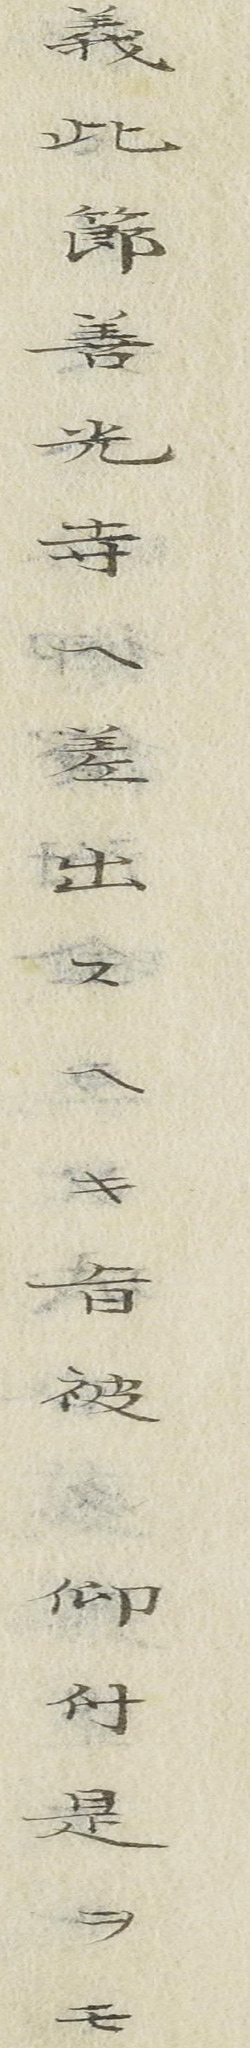義此節善光寺ヘ差出スヘキ旨被仰付是ヲモ
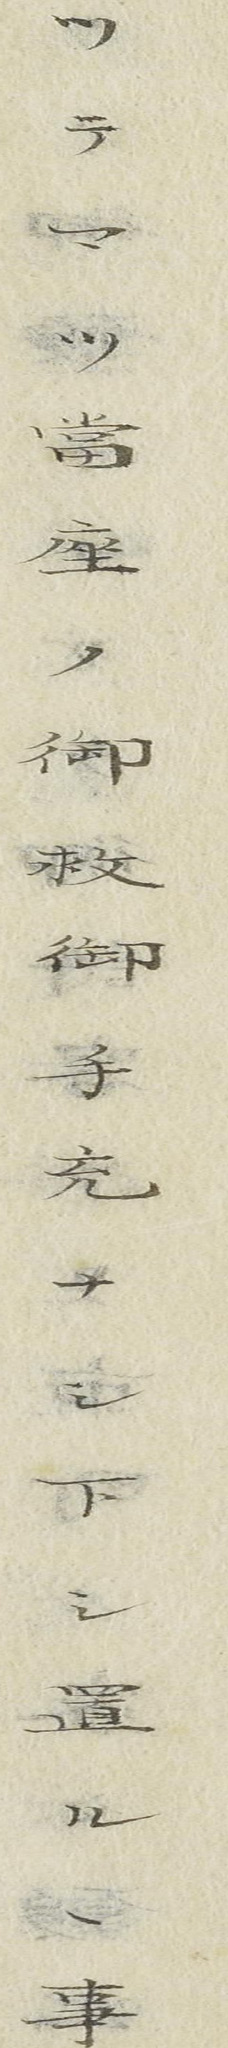ツテマツ当座ノ御救御手充ナシ下シ置ルヽ事
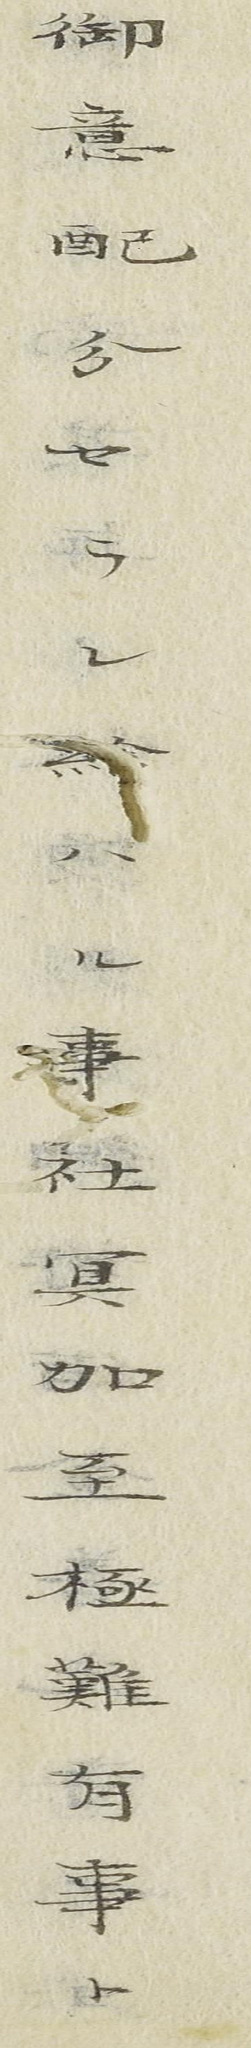御意配分セラレ給ハル事社冥加至極難有事ト

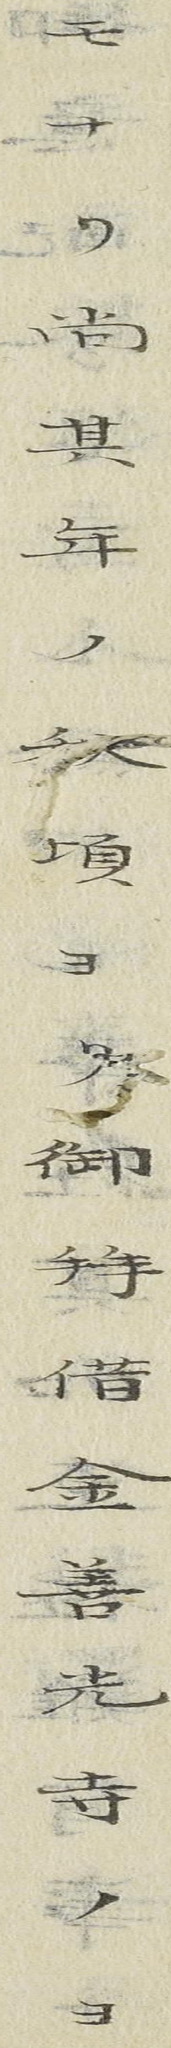モナリ尚其年ノ秋頃ヨリ御拝借金善光寺ノヨ
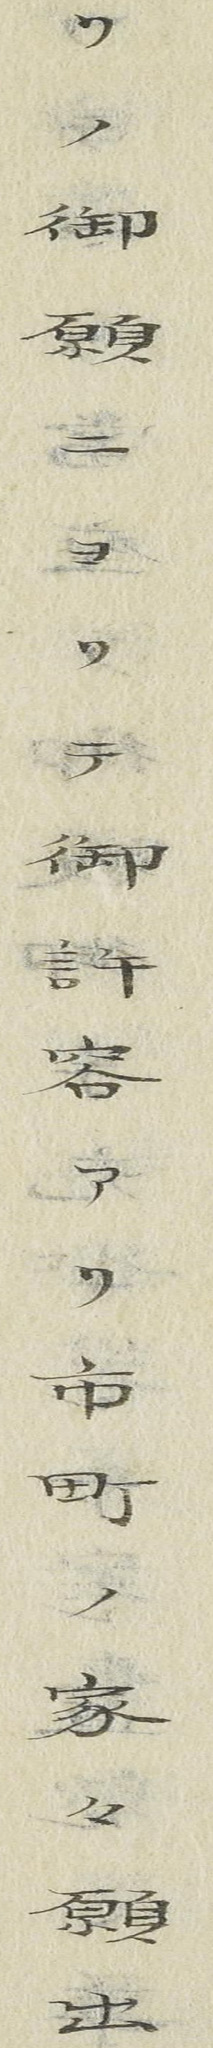リノ御願ニヨリテ御許容アリ市町ノ家々願出
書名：地災撮要　地震之部　巻ノ二
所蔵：東京大学地震研究所図書室 Earthquake Research Institute Library, The University of Tokyo, JAPAN
